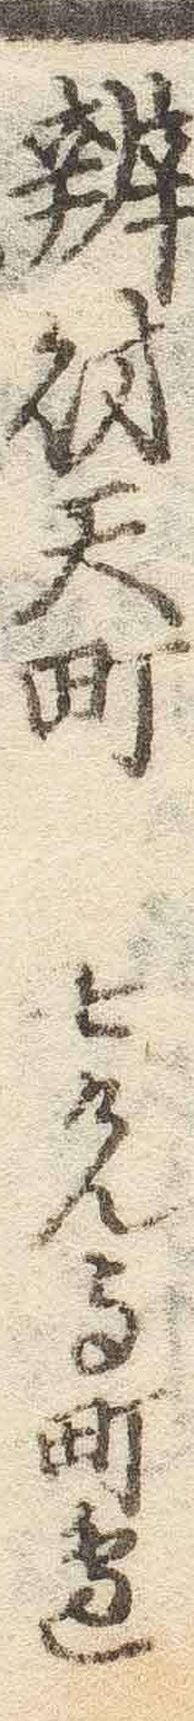弁財天町七けん寺町辺
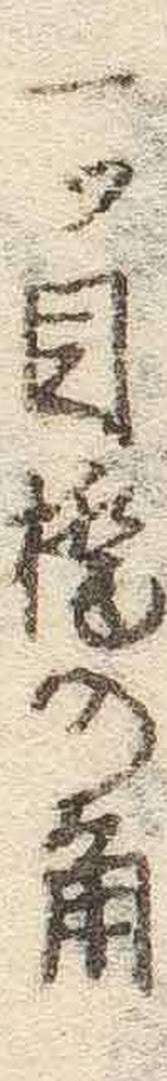一ッ目橋の角
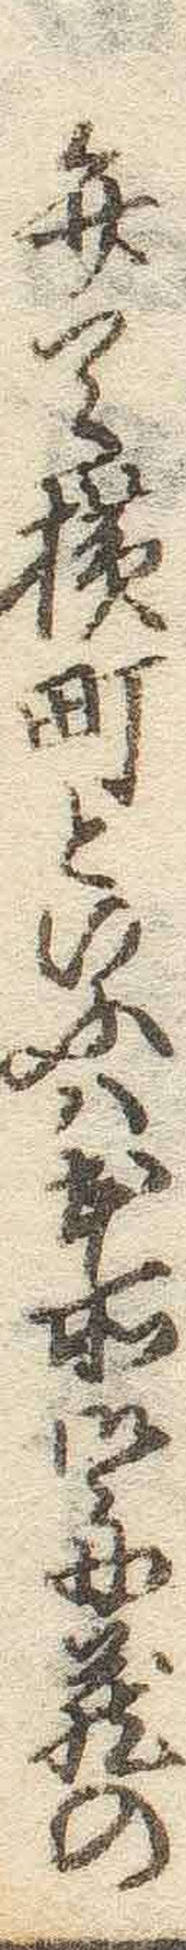弁天横町といふは本所御舟蔵の
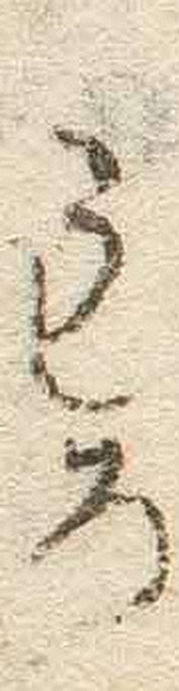うしろ
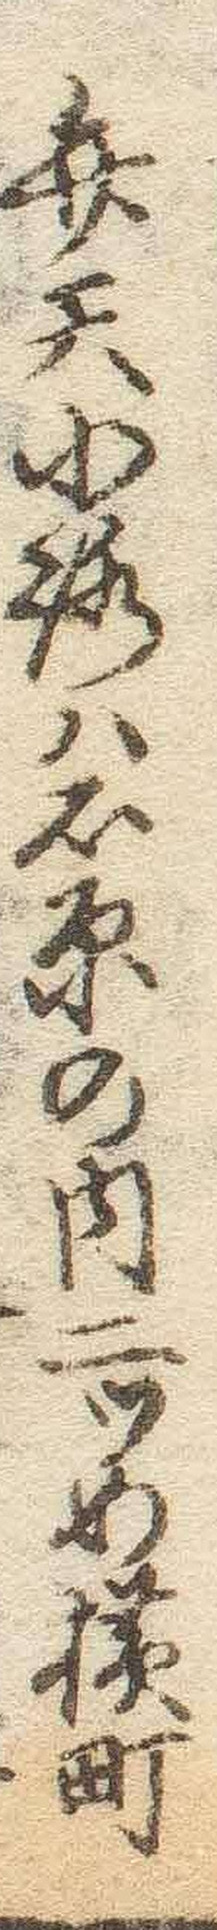弁天小路は石原の内二ッめ横町
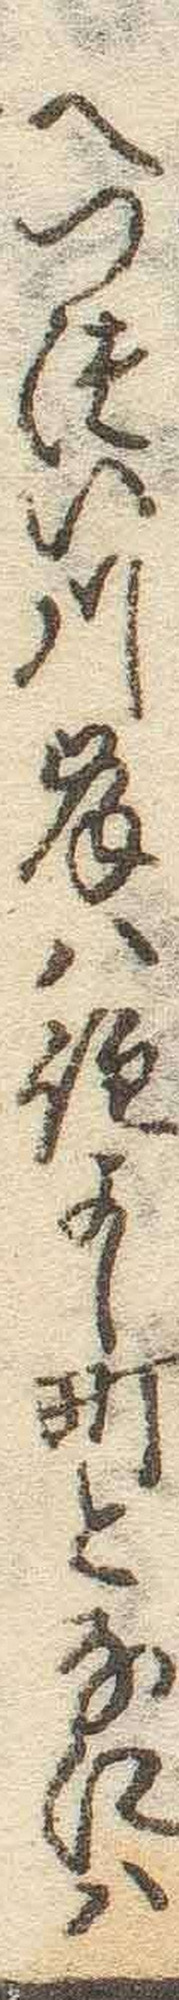へつつい川岸は住よし町となには
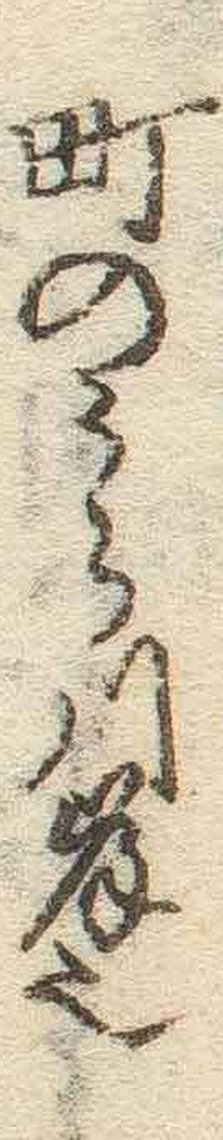町のうら川岸也
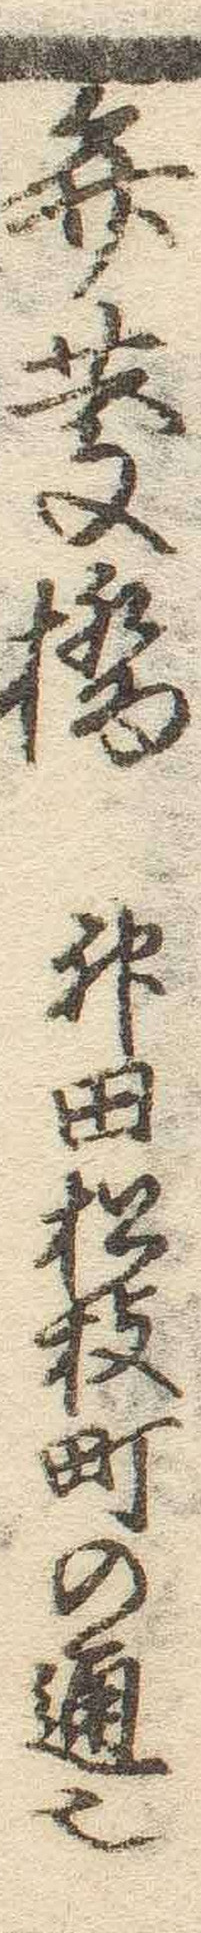弁慶橋神田松枝町の通也
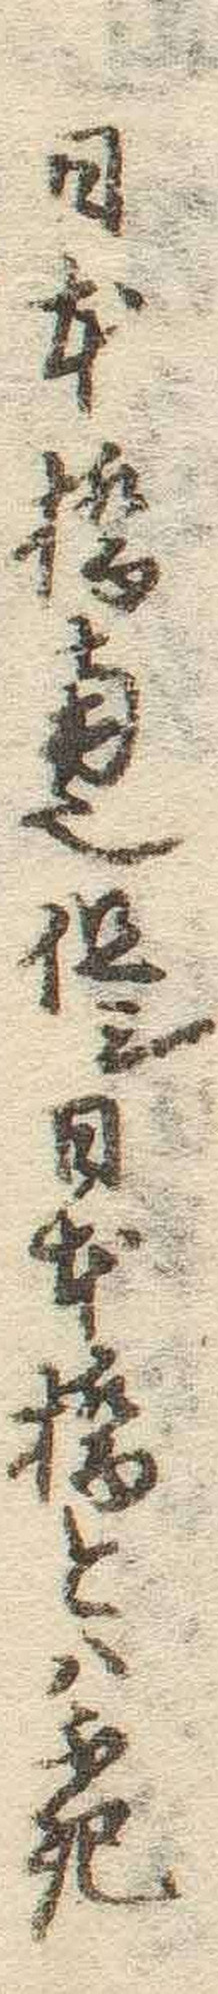日本橋南也但し日本橋とは不記
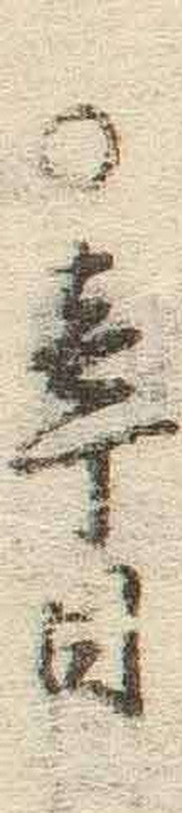◦壱丁目
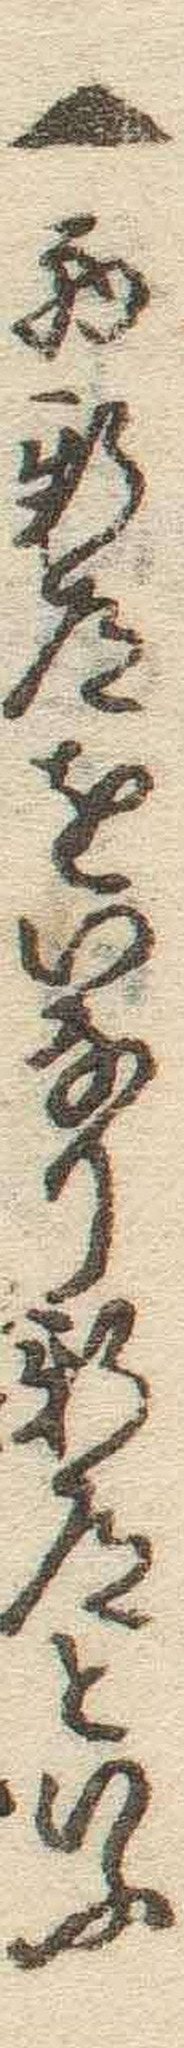▲西新道をいなり新道といふ
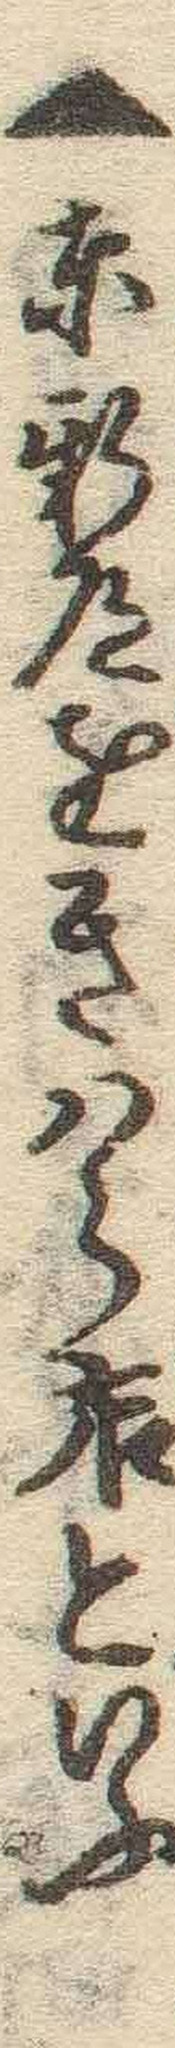▲東新道をきはら店といふ
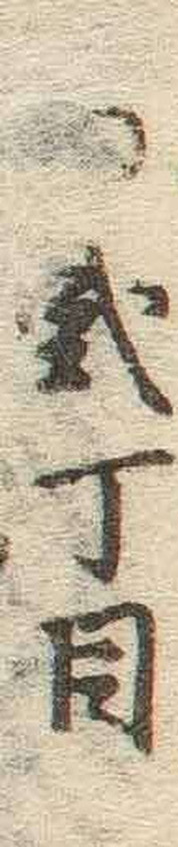◦弐丁目

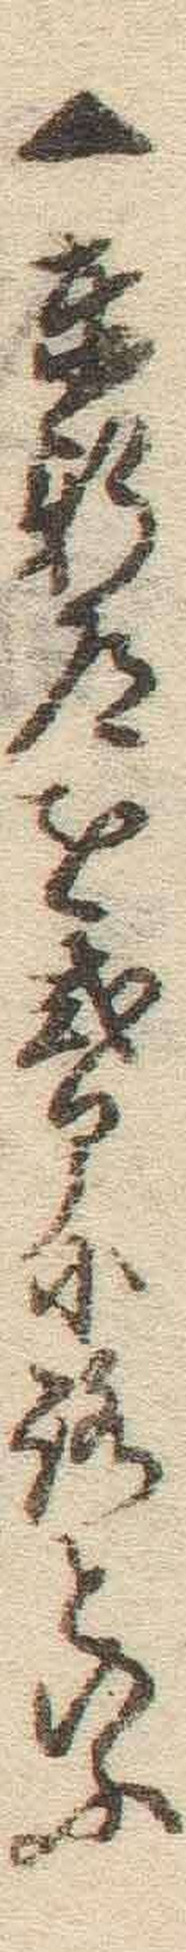▲東新道を式部小路といふ
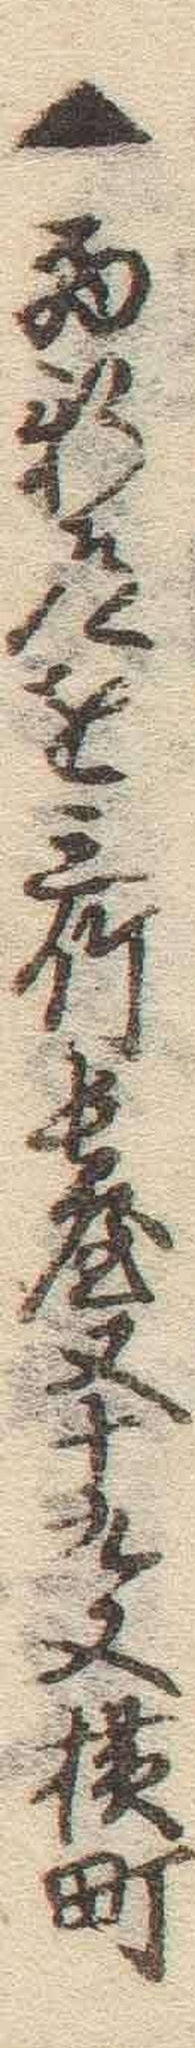▲西新道を三竹長屋又十九文横町
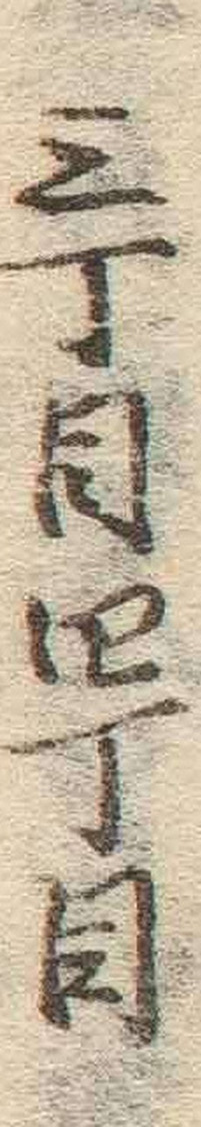三丁目四丁目
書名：江戸町独案内
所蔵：東京学芸大学附属図書館 国文学研究資料館
